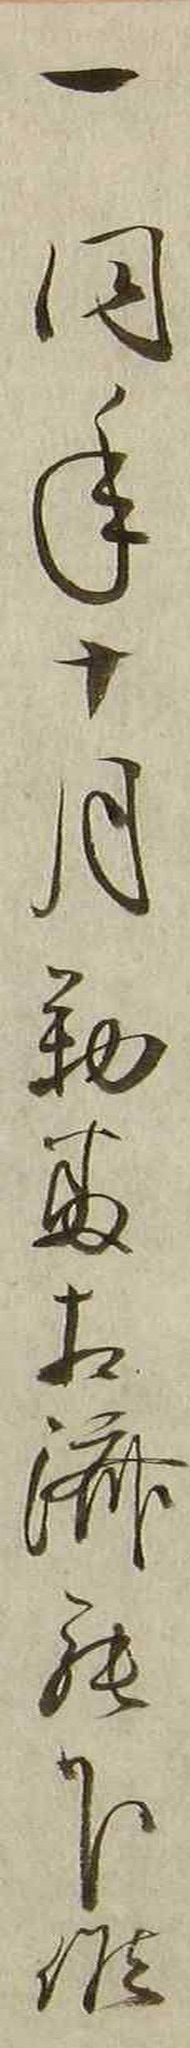一同年十月勤番相済罷下候
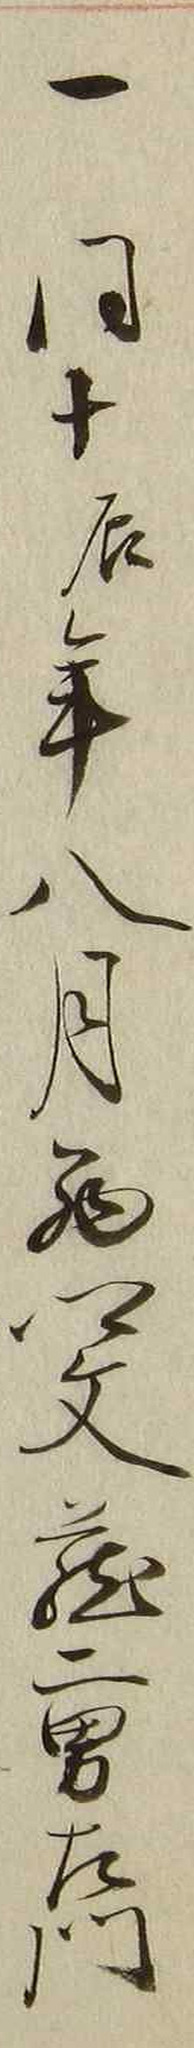一同十辰年八月西郷文蔵二男左門
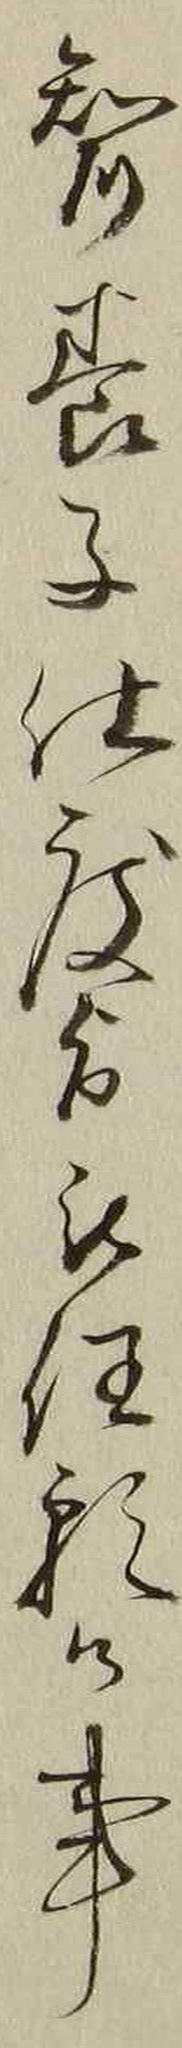聟養子仕度旨被任願候事
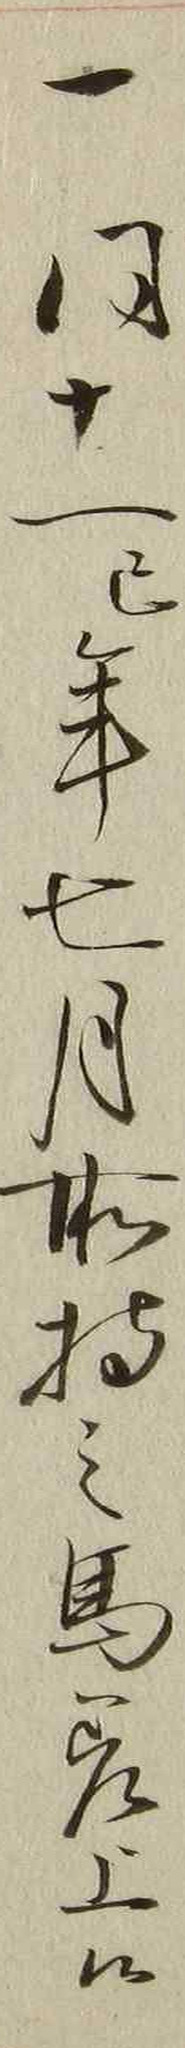一同十一巳年七月所持之馬差上侯
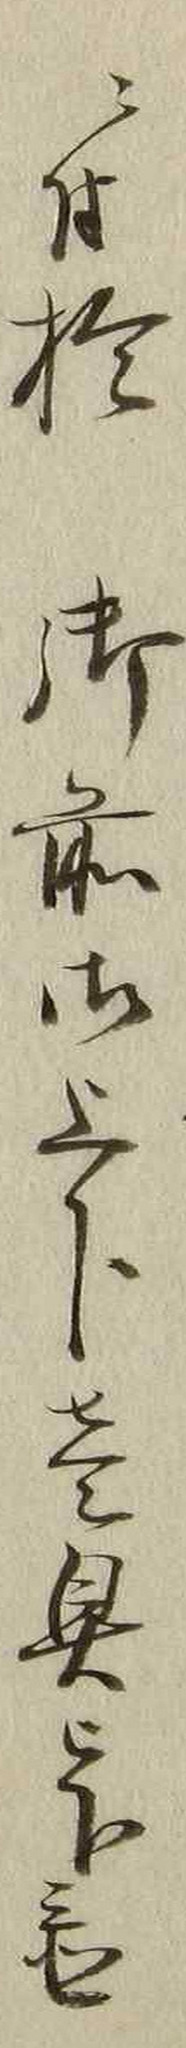に付於御前御上下壱具被下置
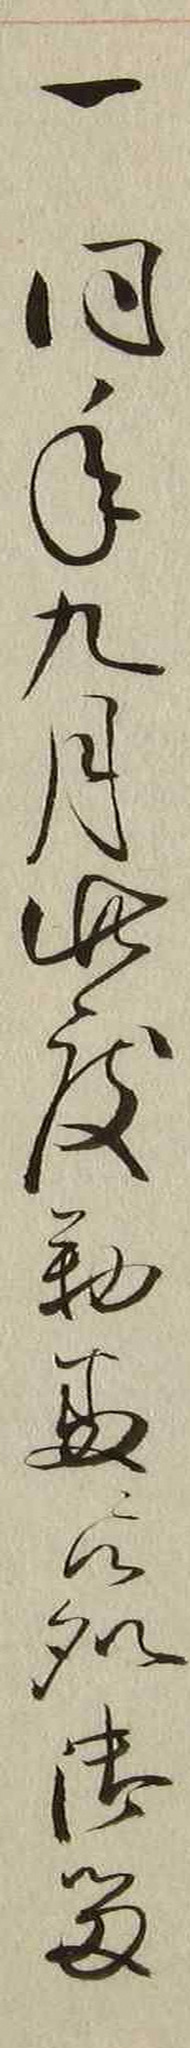一同年九月此度勤番に候処留
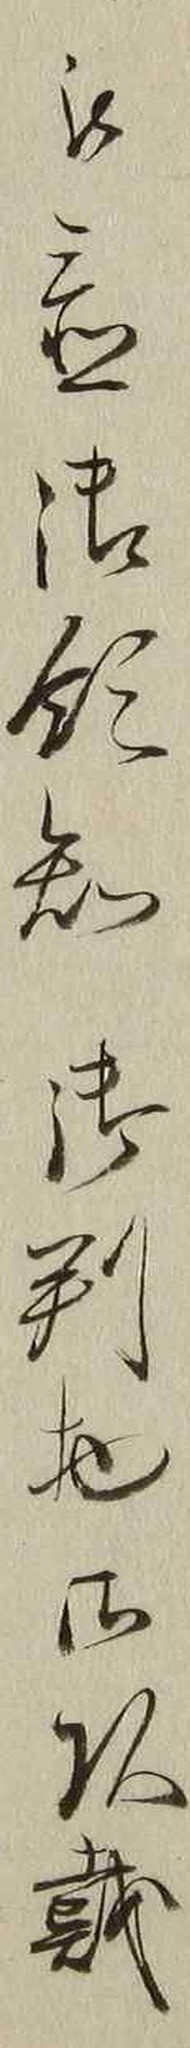被置御領知御判物御頂戴
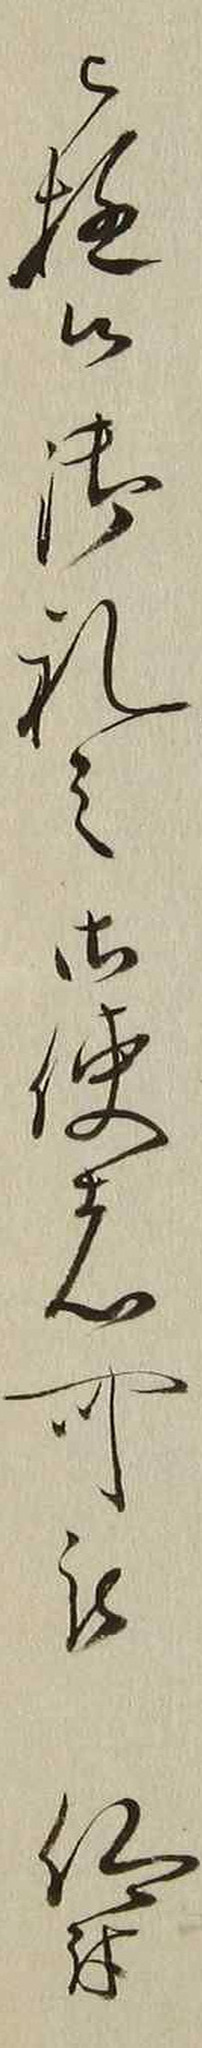被遊候御礼之御使者可被仰付
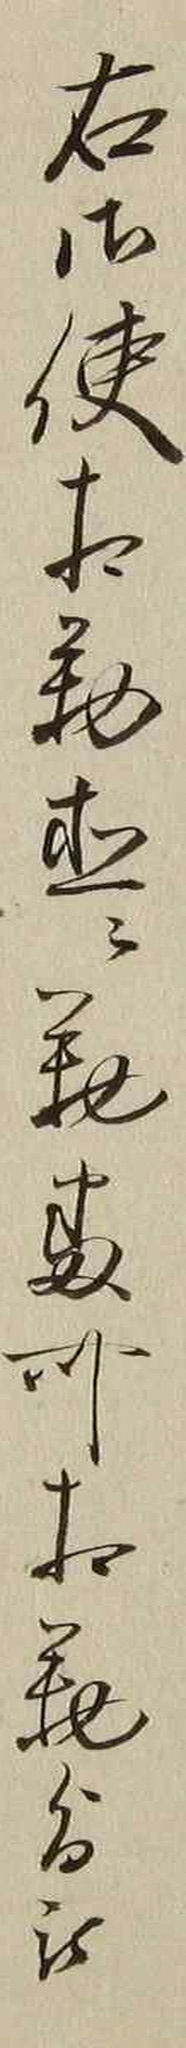右御使相勤直に勤番可相勤旨被
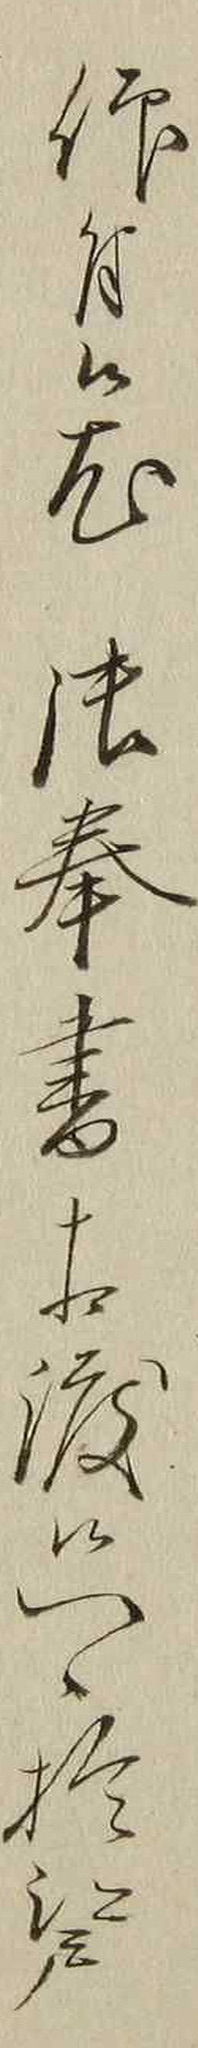仰付候尤御奉書相渡候はゝ於江戸
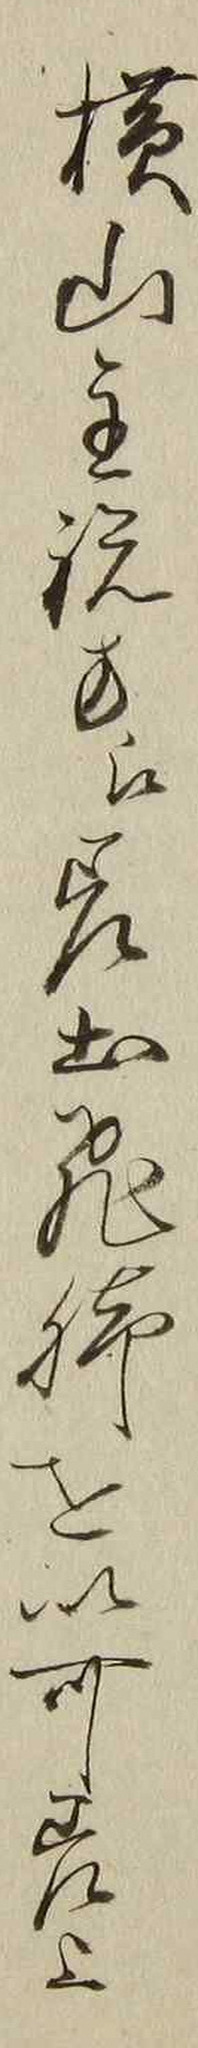横山主税方江差出飛脚を以可差上
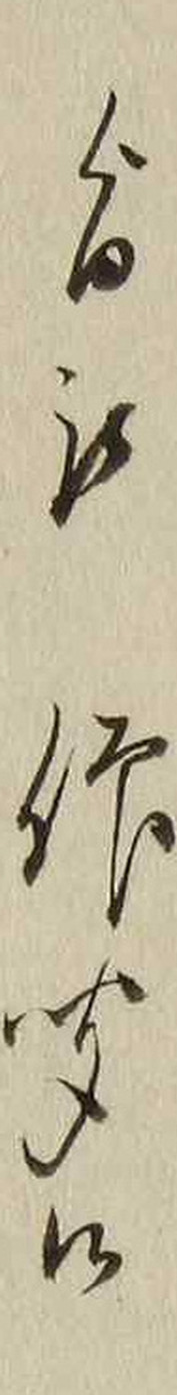旨被仰聞候
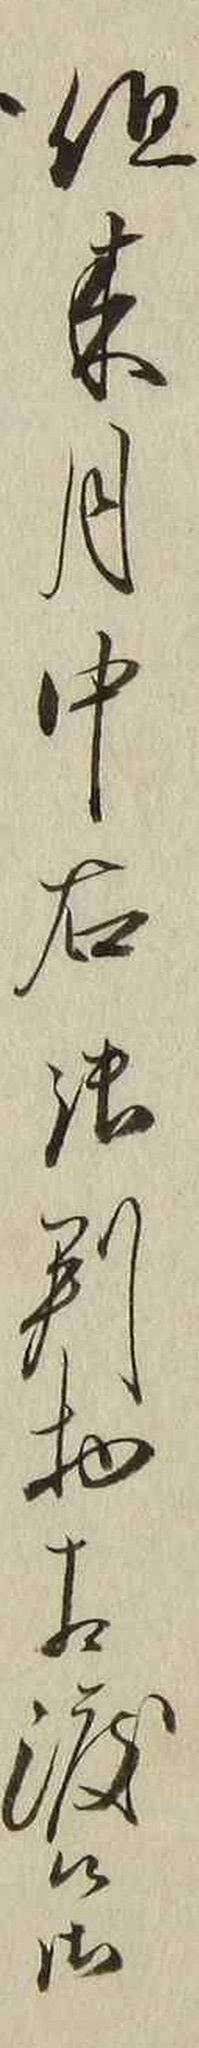但来月中右御判物相渡候御
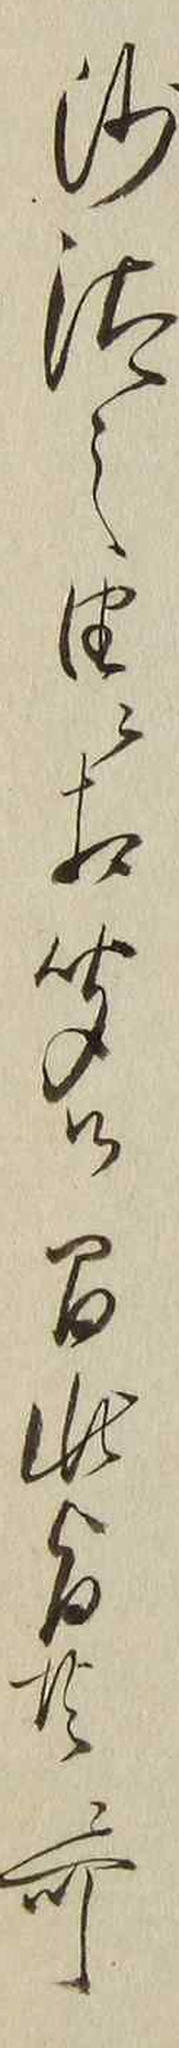沙汰之儀に相聞候間此旨共に可
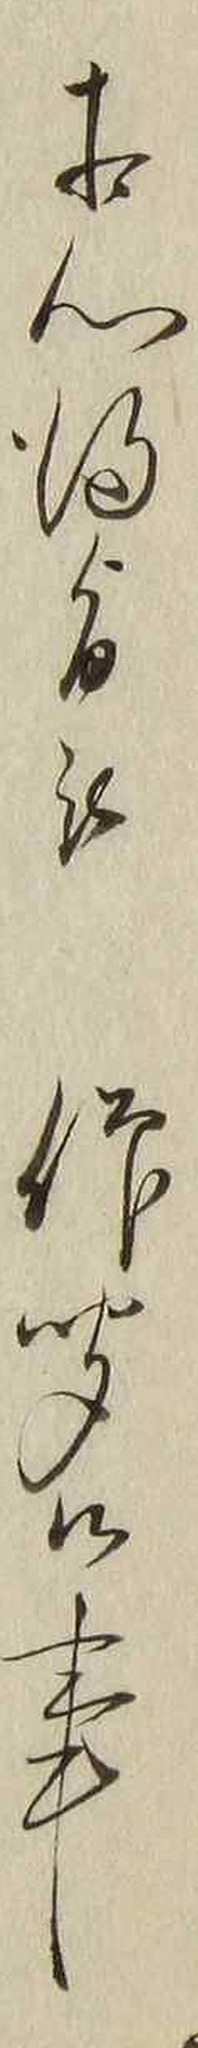相心得被仰聞候事
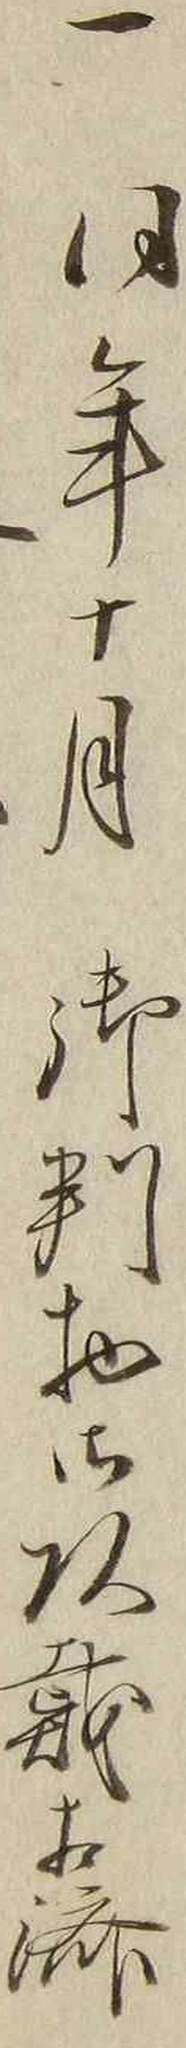一同年十月御判物御頂戴相済
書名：諸士系譜　巻之103　か之部11
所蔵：会津若松市立会津図書館
